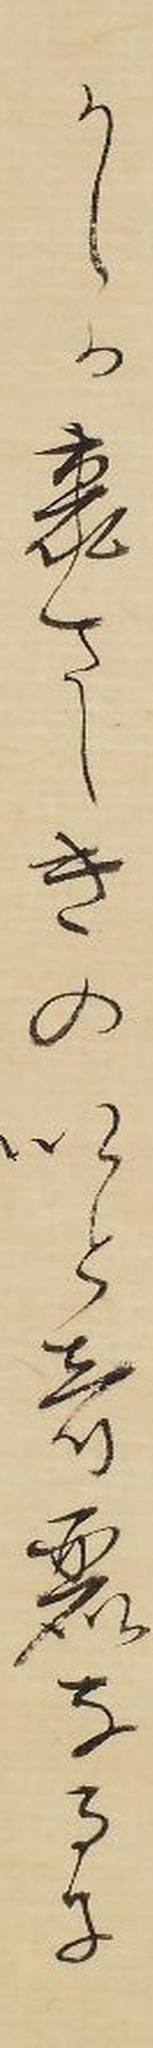かしか裏さしきのいと奇麗なるに
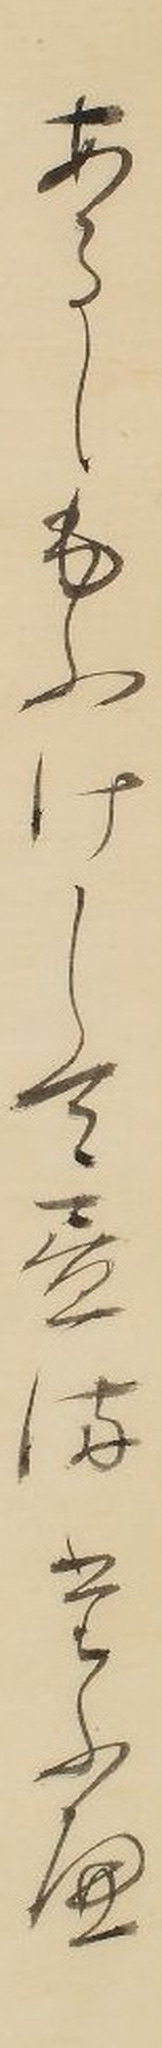あるしもふけして昼またふへ
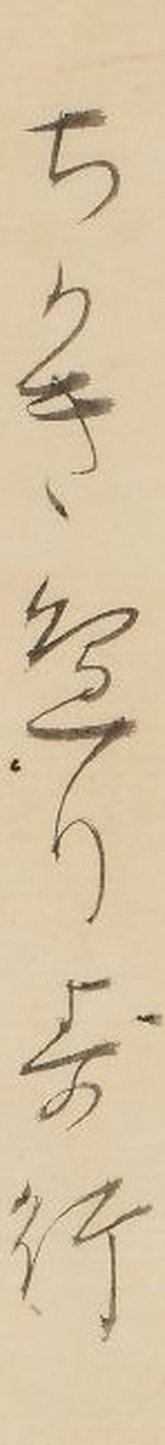ちかき辺り歩行
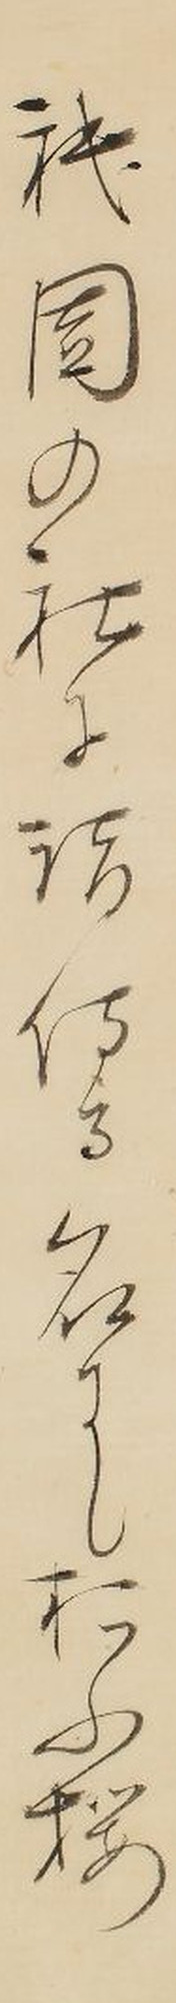祇園の社に詣侍る名にしおふ桜
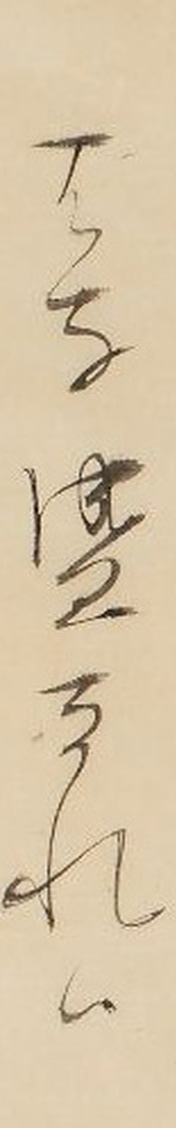はな盛なれは
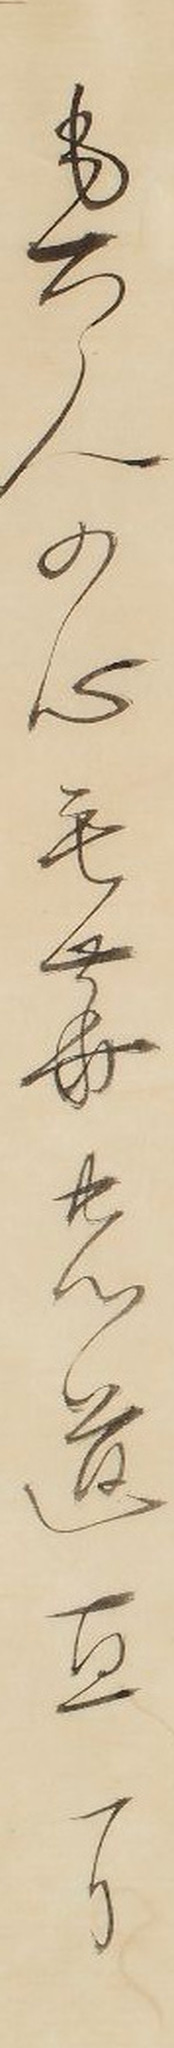もろ人の心も華の道直に
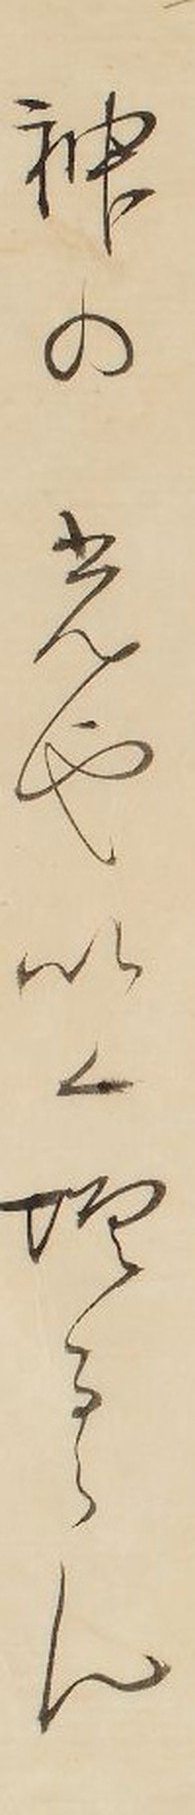神の光やいく増るらん
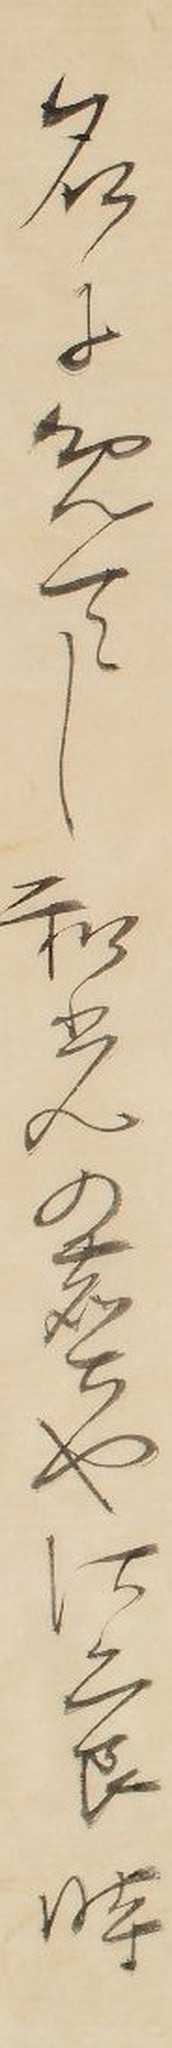名にめてし和光の塵やさくら時
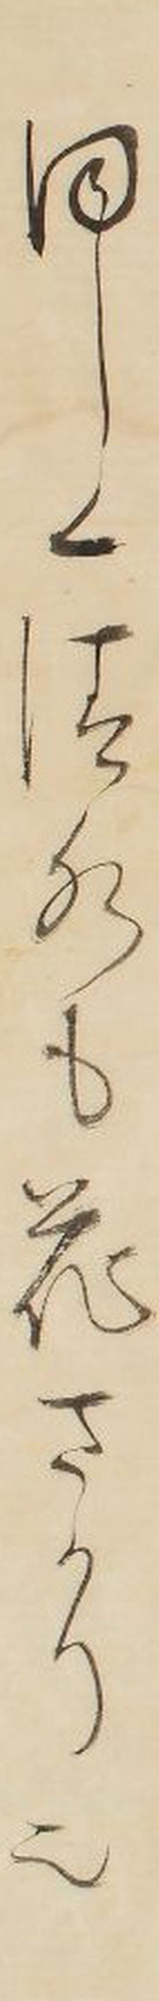同しく清水も花さかり也
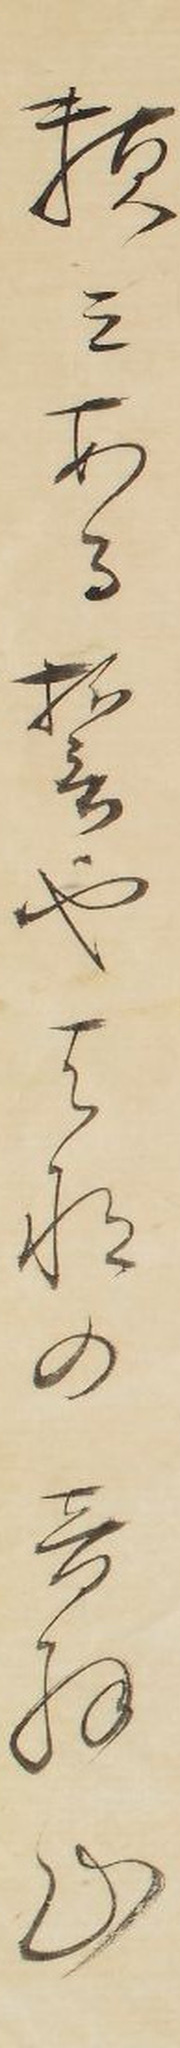頼みある誓やはなの音羽山

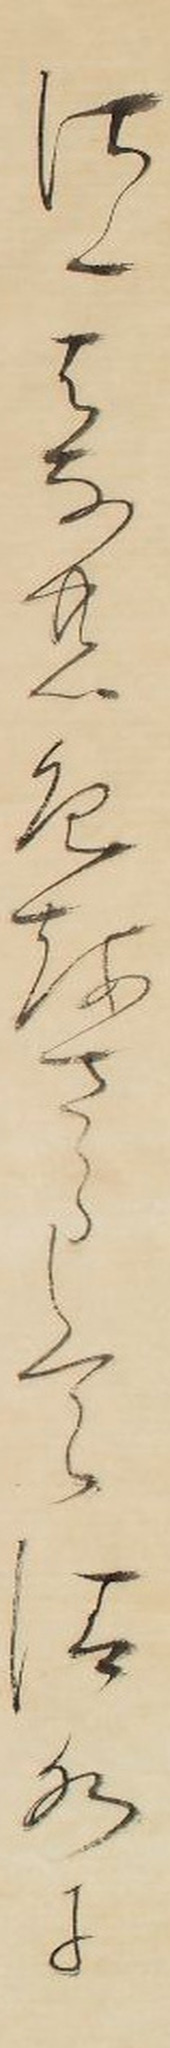さくはなの色をさらして清水に
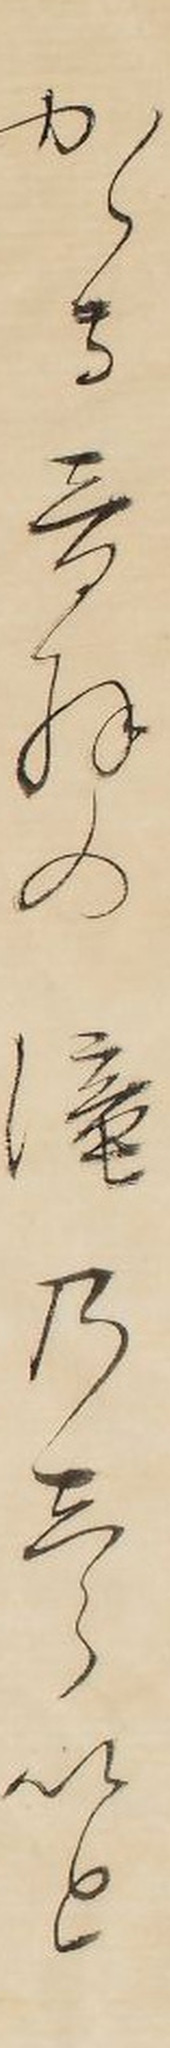かゝる音羽の滝のしらいと
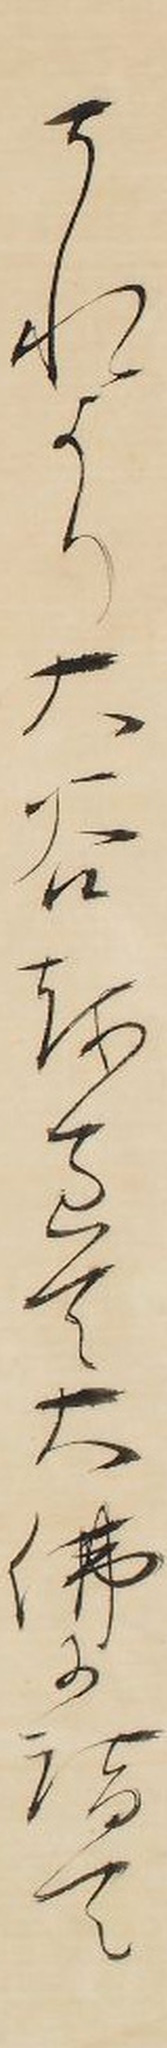それより大谷を過て大仏に詣て
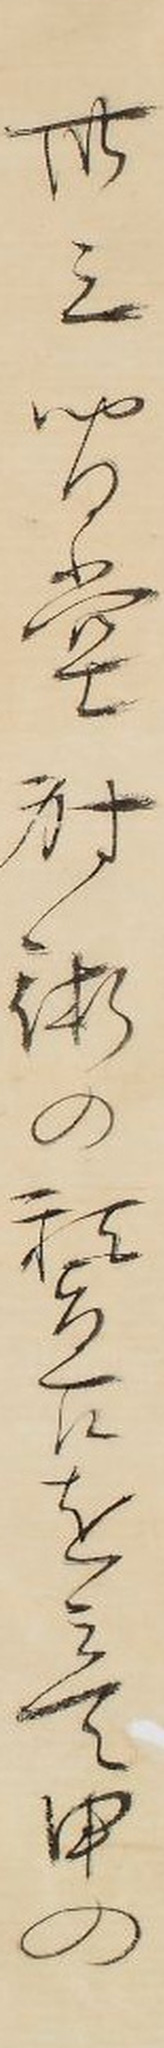卅三間堂射術の稽古をみて申の
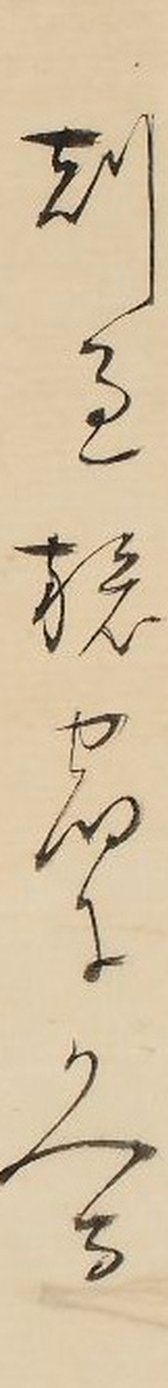刻過旅宿にかへる
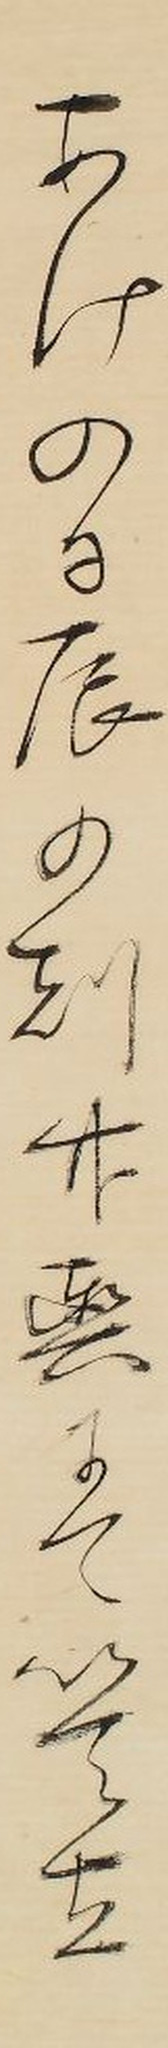あけの日辰の刻竹輿にていて立
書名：花土産
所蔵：徳島県立図書館
